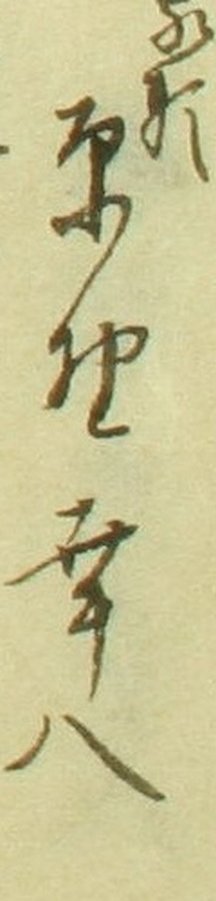原野幸八
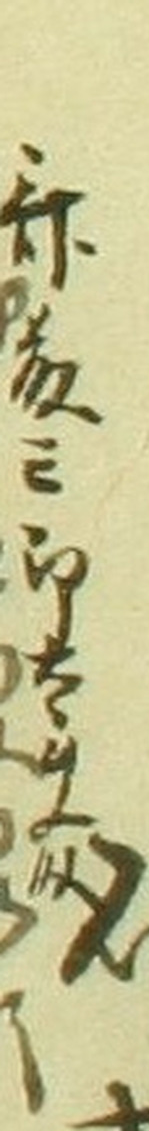斉藤三郎太夫殿
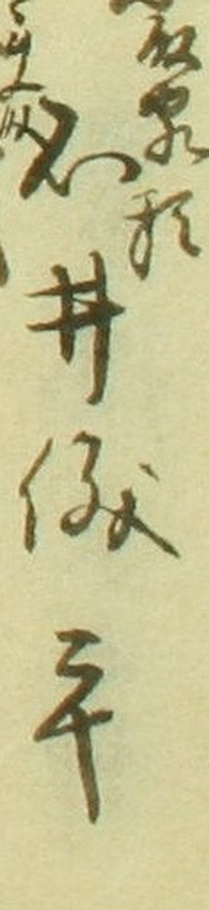石井儀平
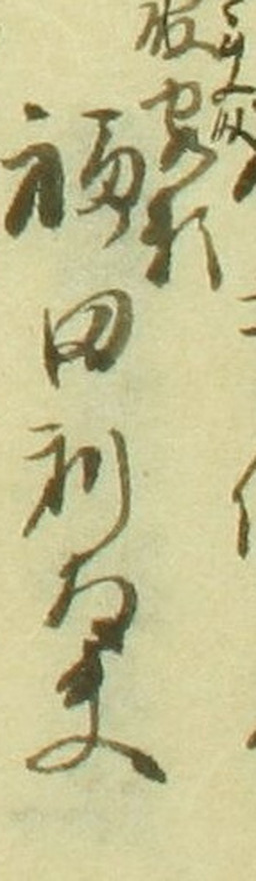福田利太夫
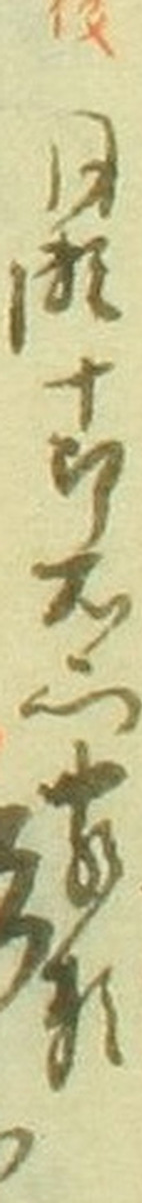月瀬十郎右衛門家頼
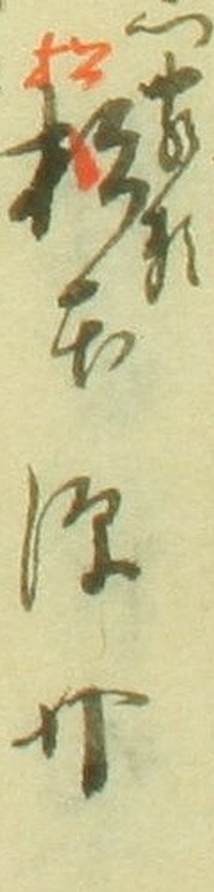松本源介
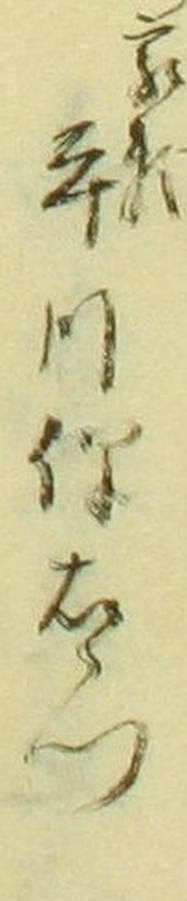平川伴右衛門
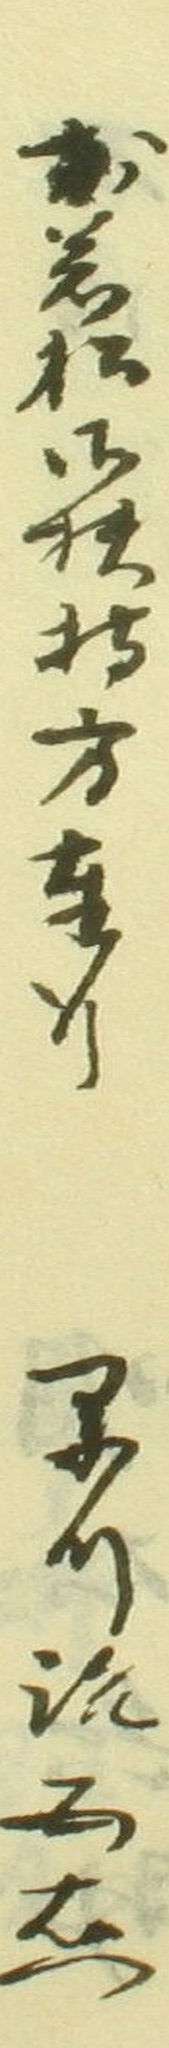若松御扶持方奉行早川治五右衛門
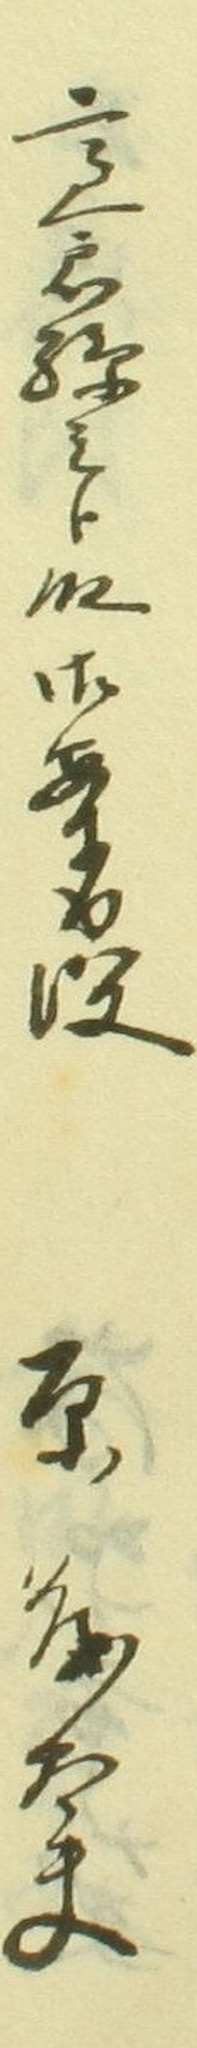高倉弥三郎殿御案内役原藤太夫
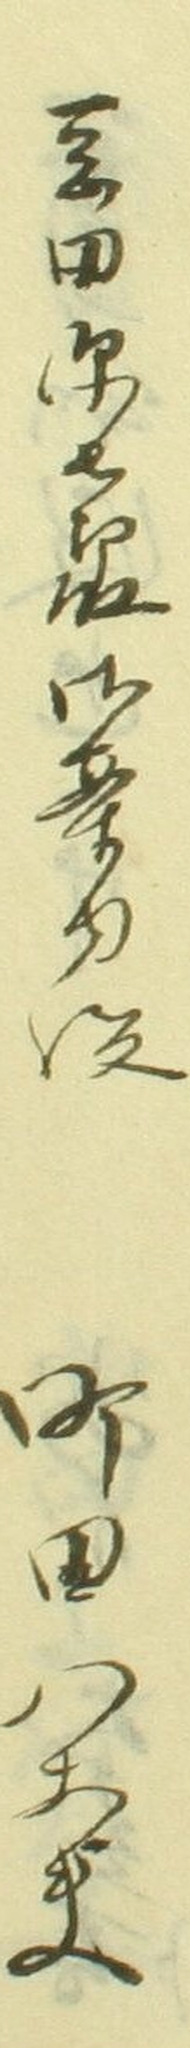岡田源七郎殿御案内役町田八太夫
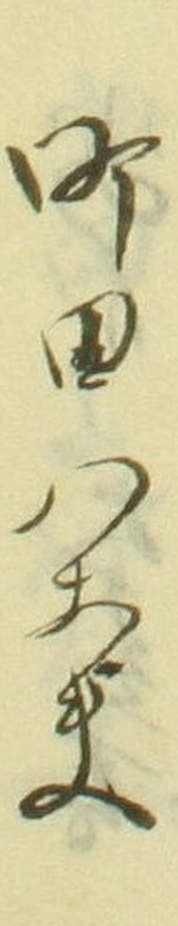福田利太夫
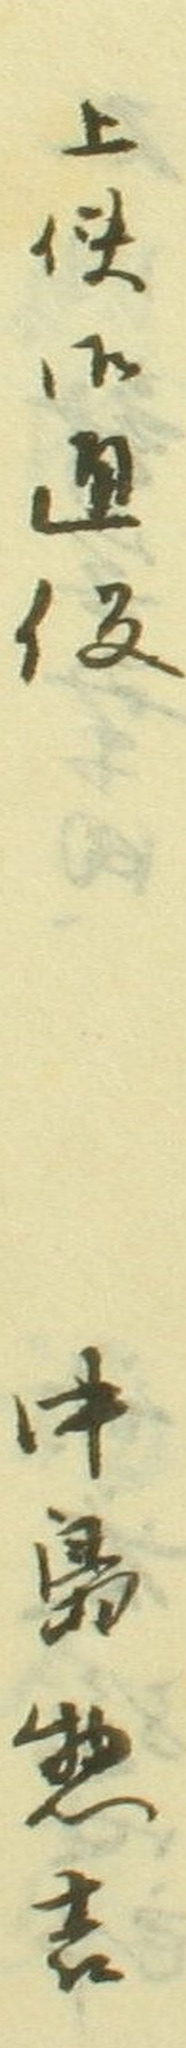上使御通役中島惣吉
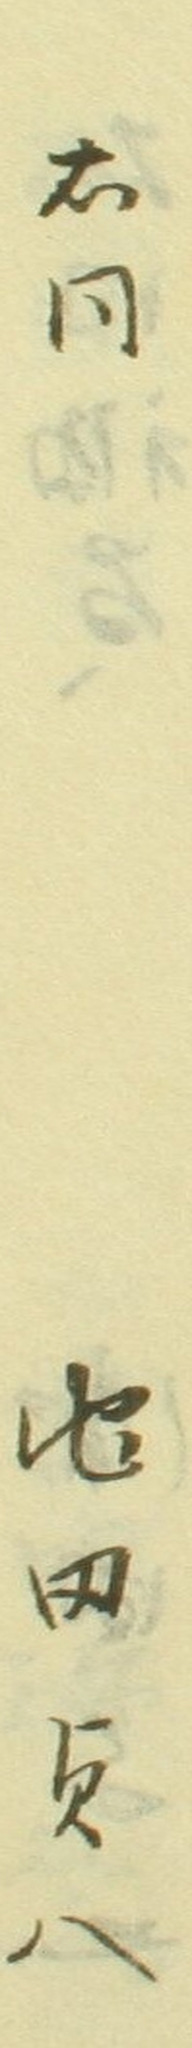右同池田貞八
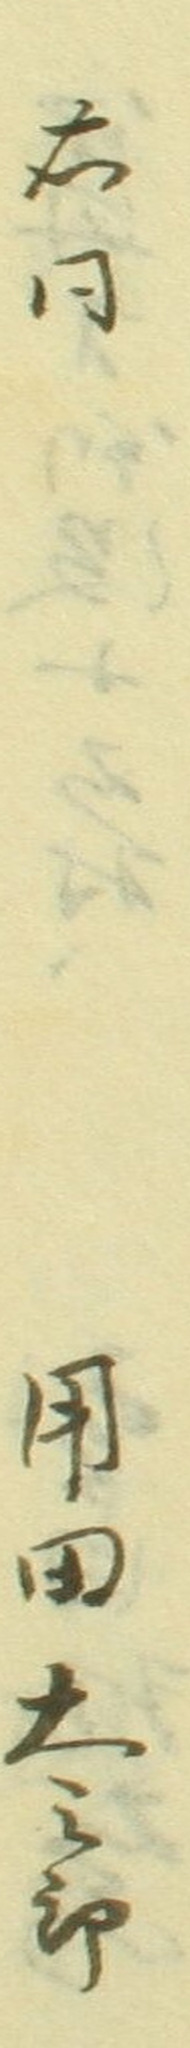右同用田大三郎
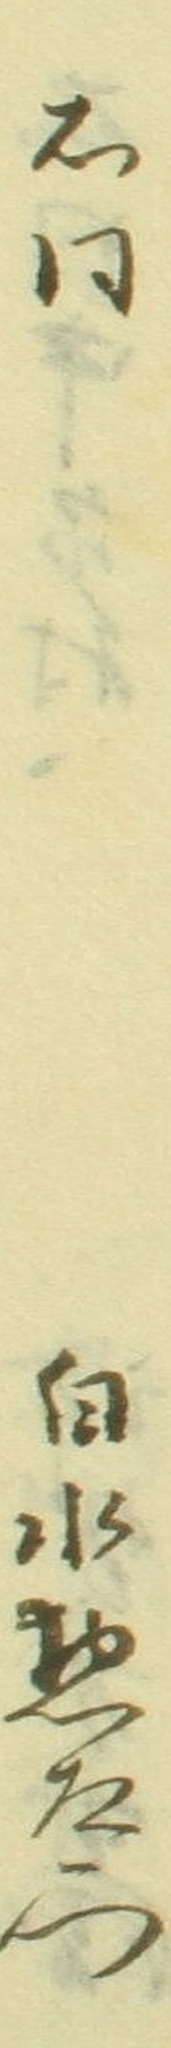右同白水惣左衛門
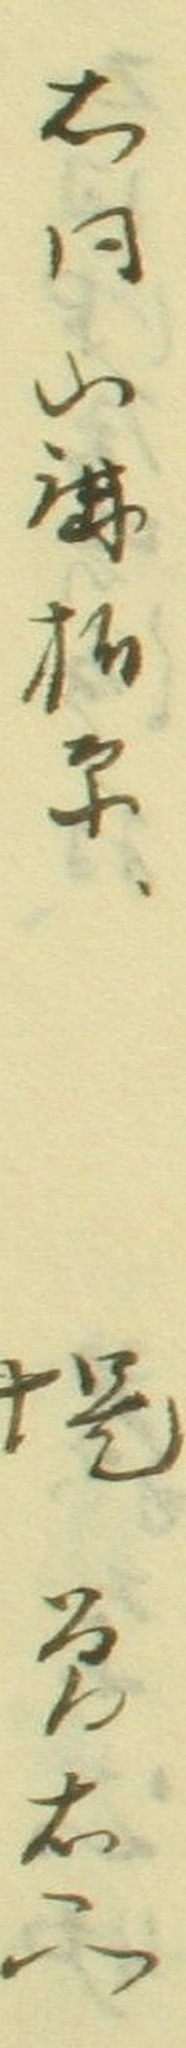右同山鹿柏原堤曽右衛門
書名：唐船漂流記 二
